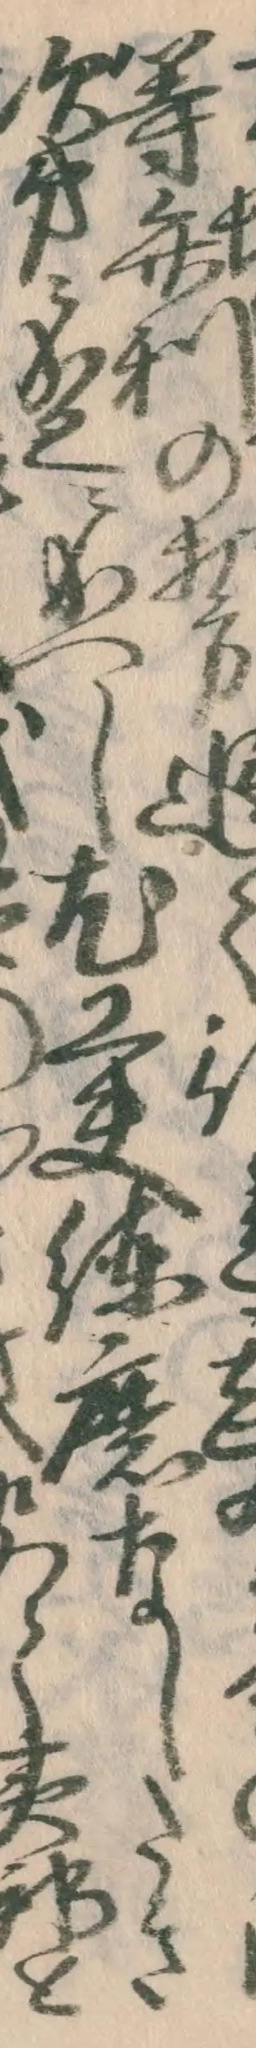次第ニ盛ニ成へし尤工夫練磨なしたき
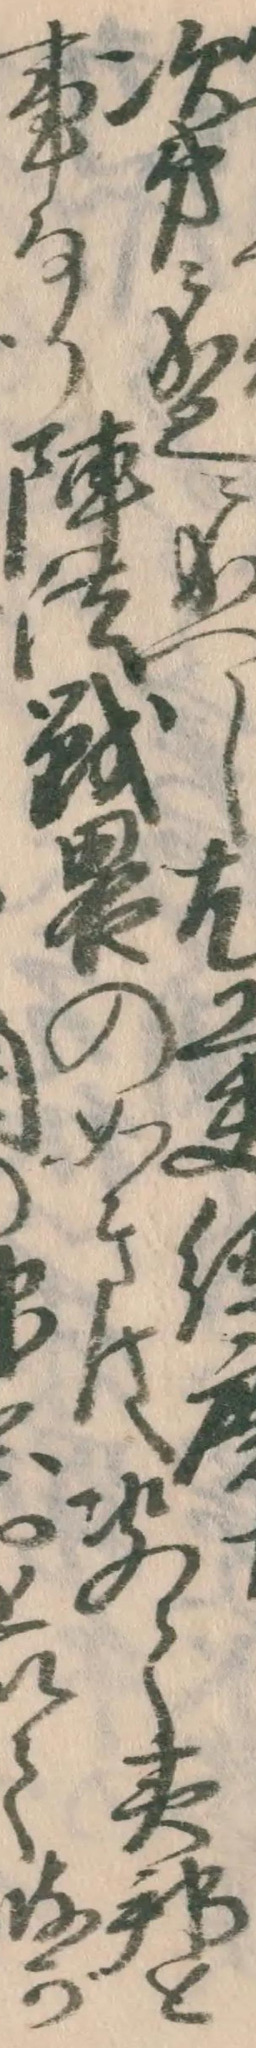事なり陣法戦略の如きは決て夷邦を
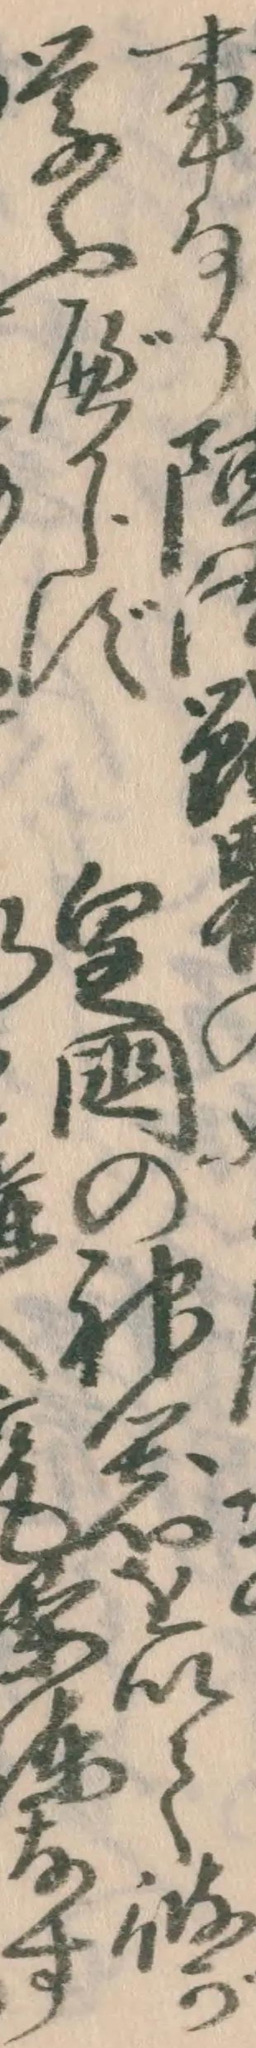学ふべからず皇国の神器を以て彼か
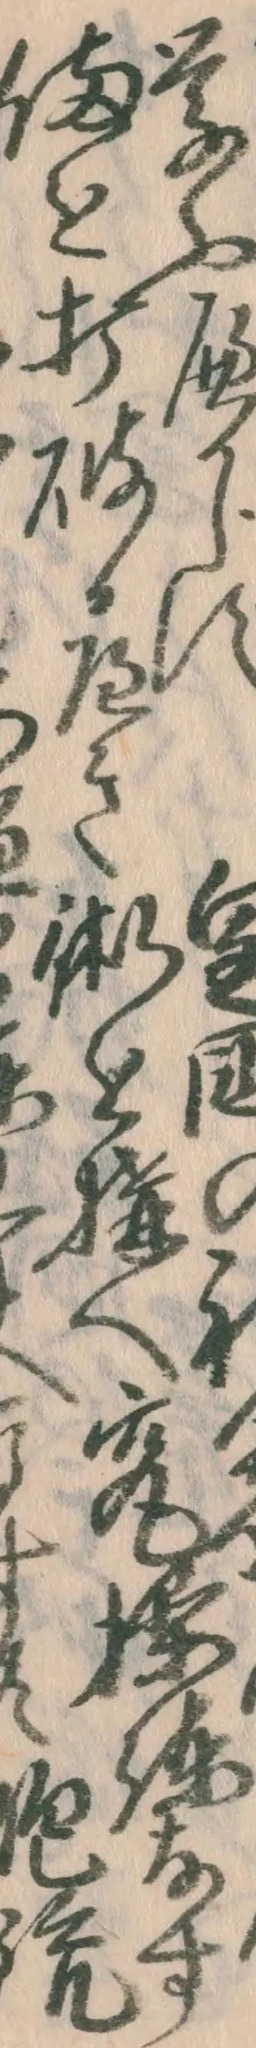備を打破るへき術を構へ究操練なす
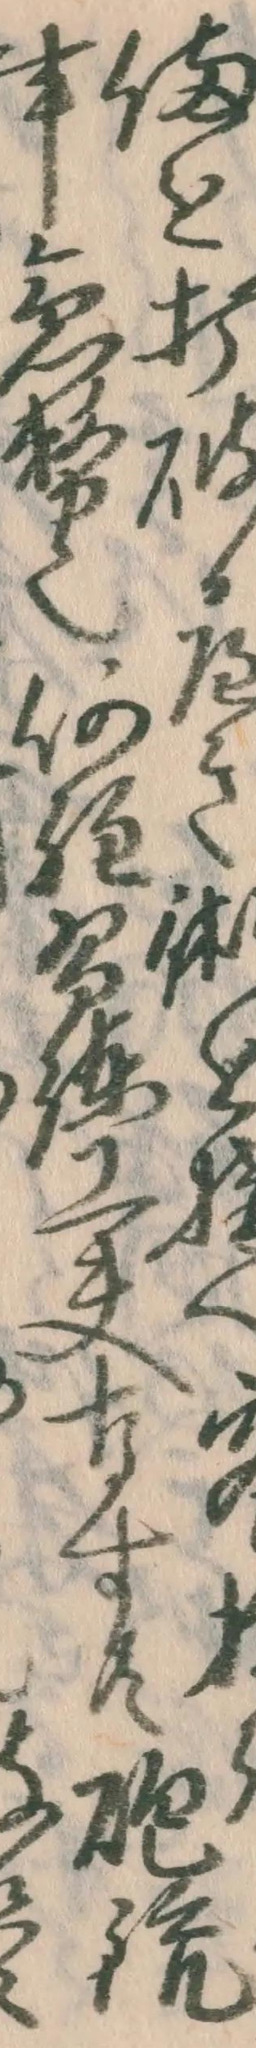事急務也何程習練工夫なす共砲銃
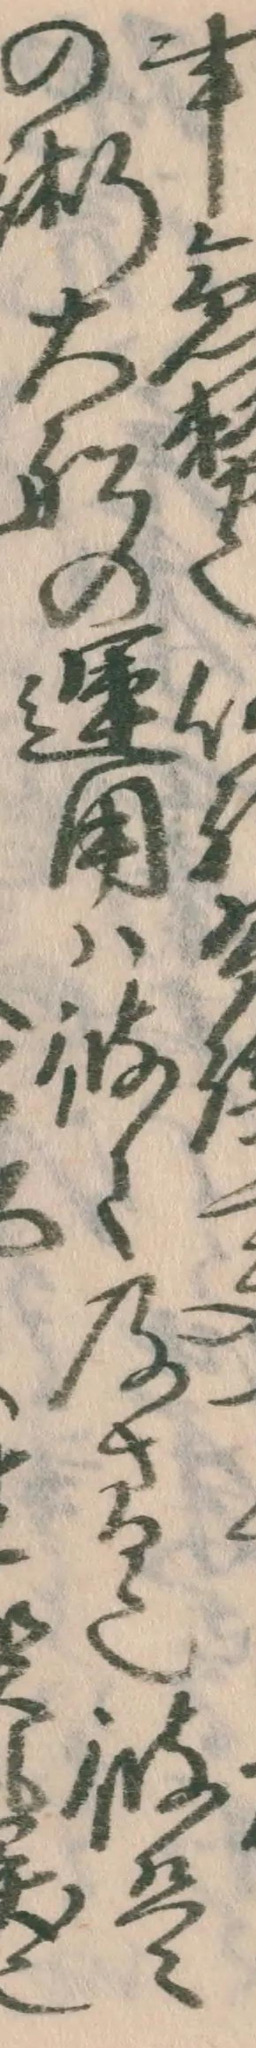の術大船の運用ハ彼に及さる也彼是
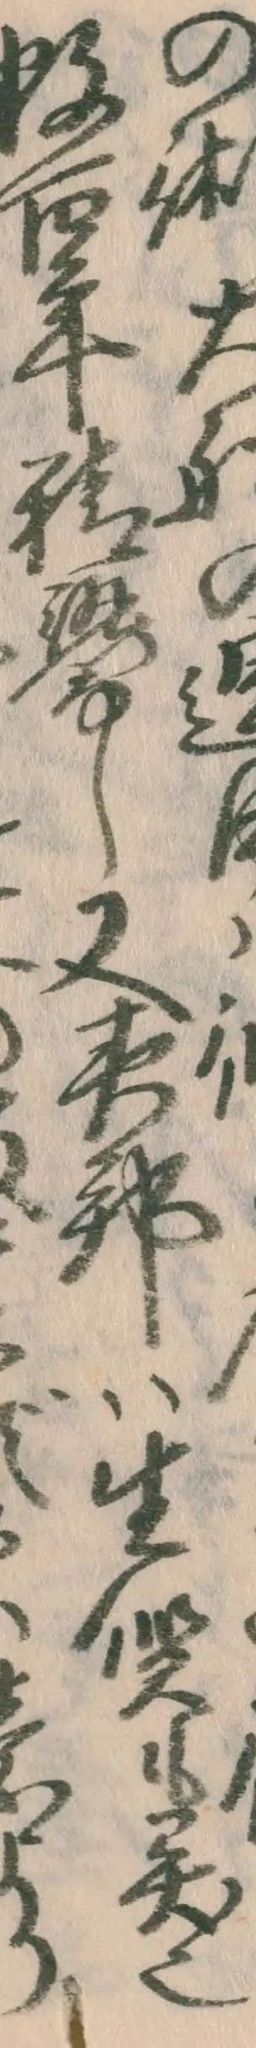数百年精熟なし又夷邦ハ生質も異也
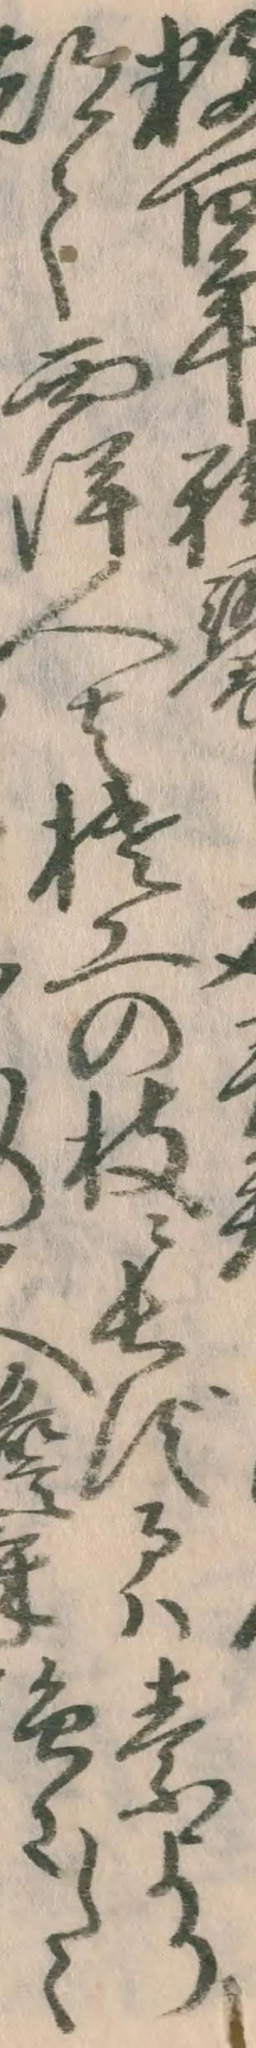都て西洋人者機工の技ニ長ずるハ素より
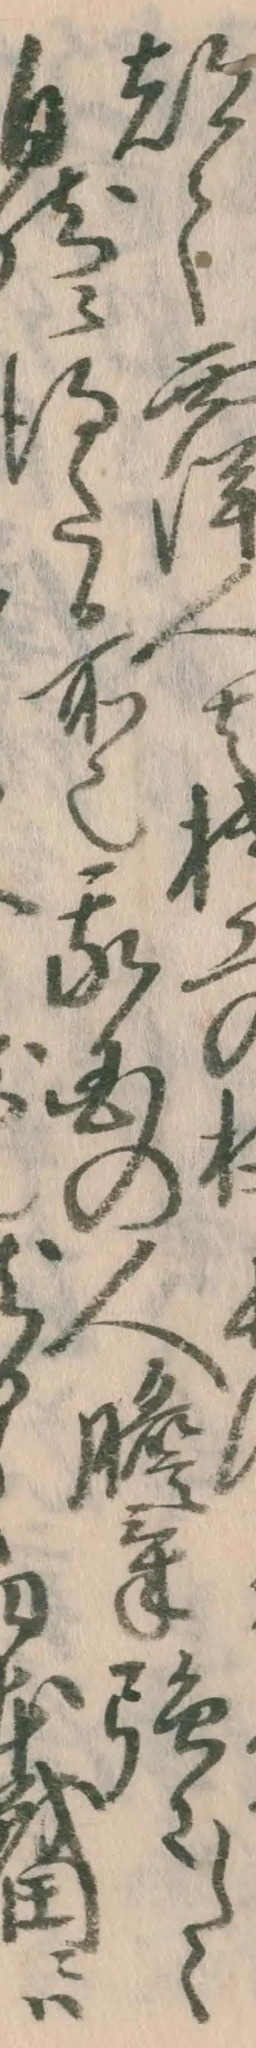自然ニ得たる所也我国の人膽氣強にして
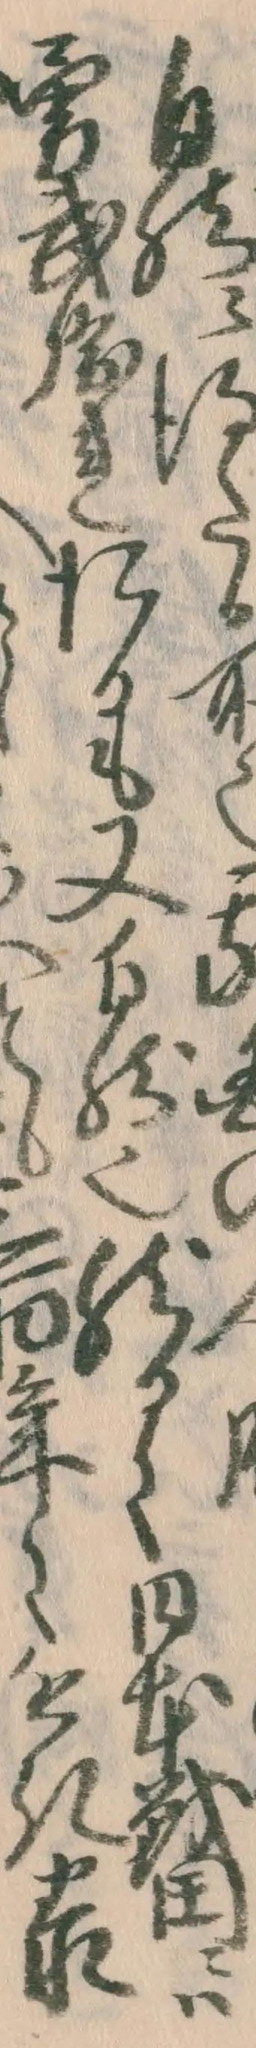勇武勝れたるも又自然也然るに日本戦国ニハ
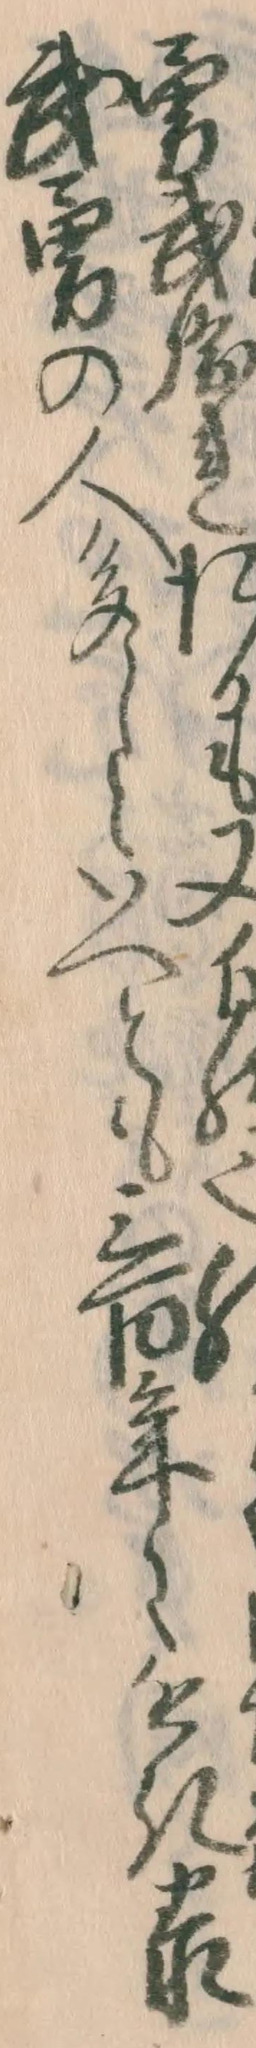武勇の人多しといへとも三百年に近き泰
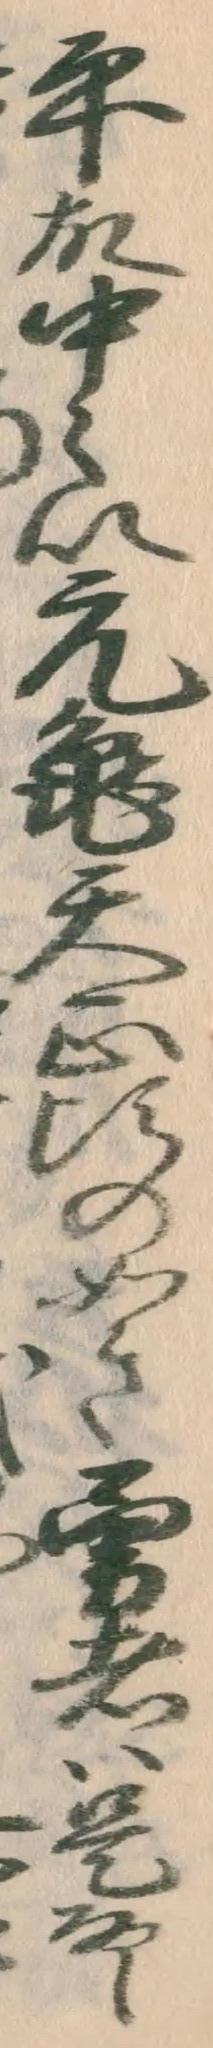平故中々以元亀天正頃の如き勇者ハ是なし
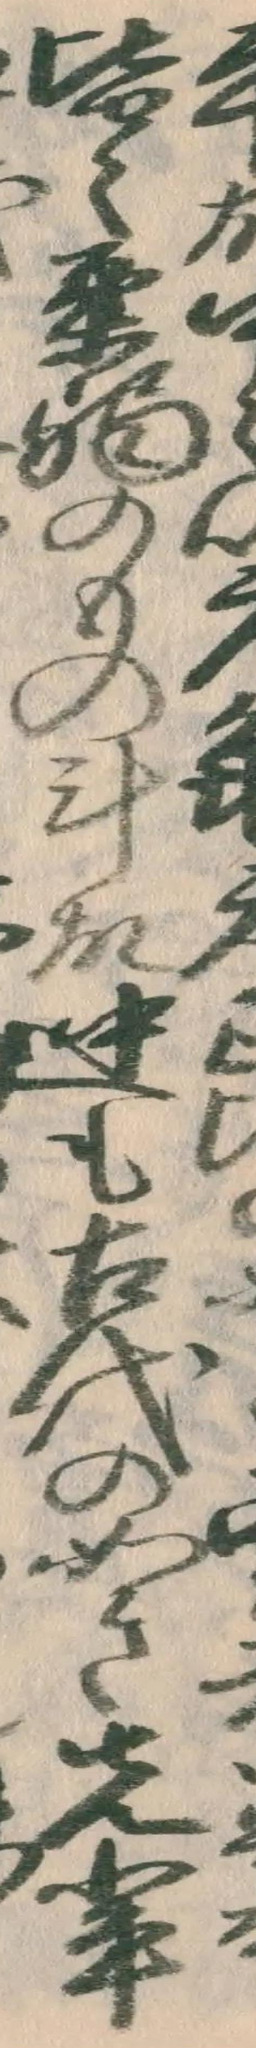皆々柔弱のもの斗故迚も古代の如き先輩
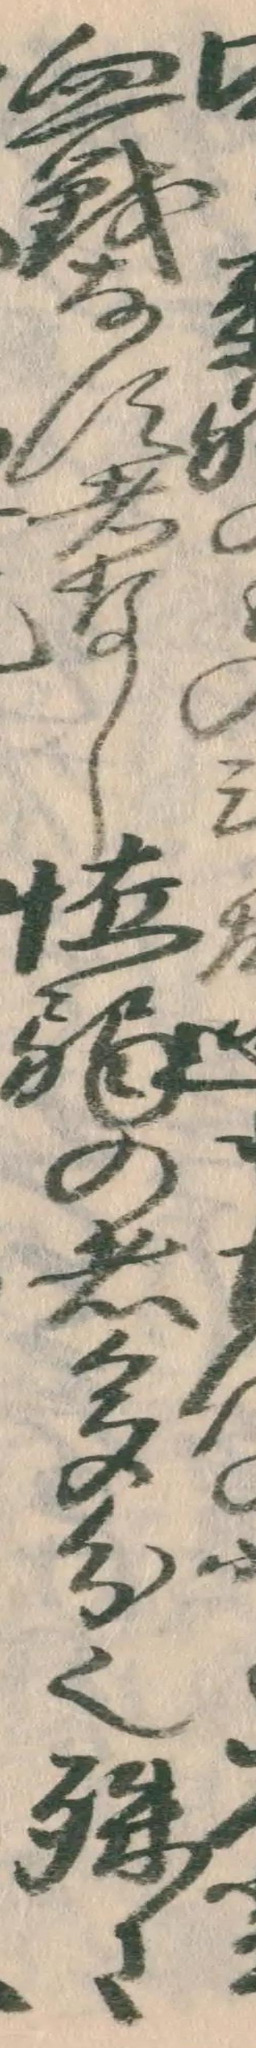血戦なす者なし恠弱の者多分也殊に
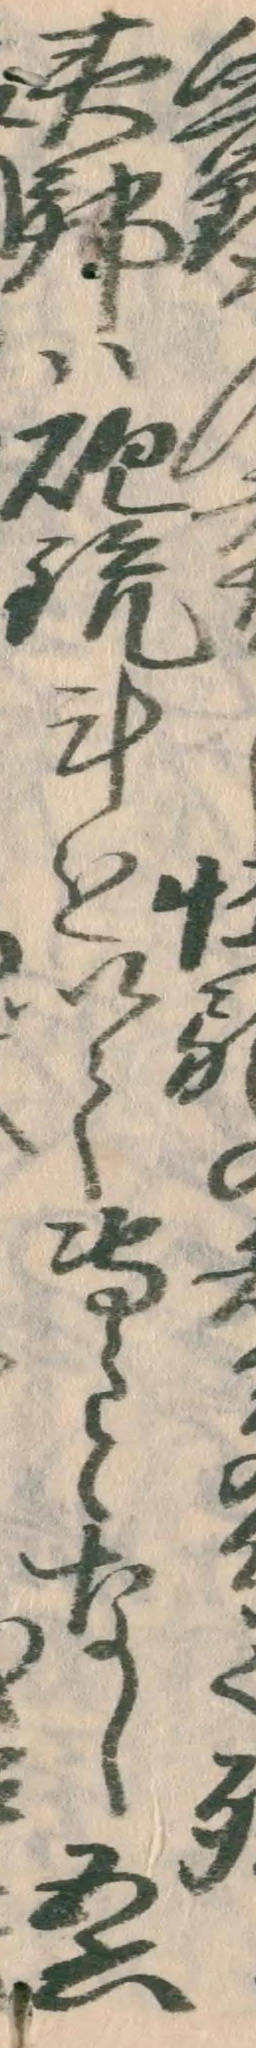夷邦ハ砲銃斗を以て専らとなし五六
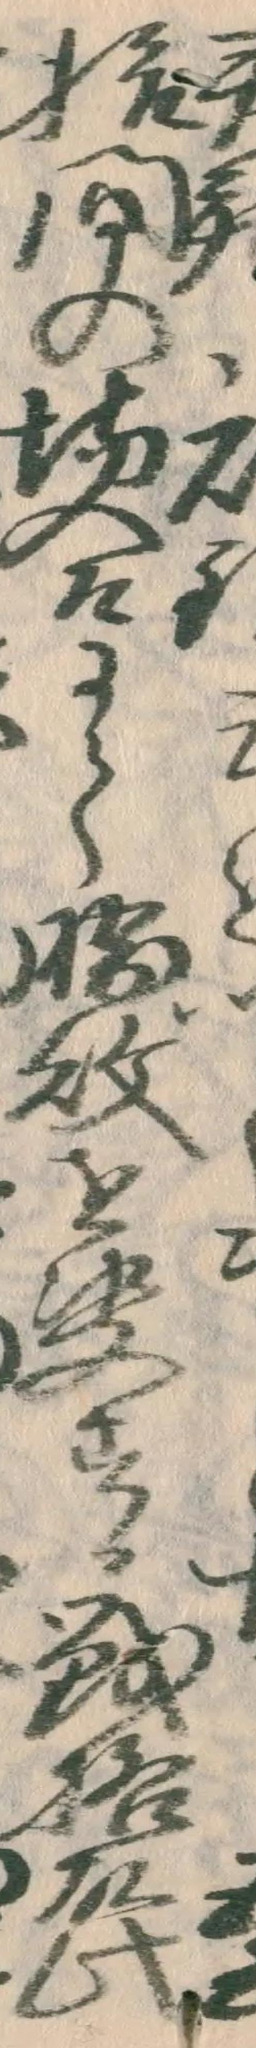拾間の場合にて勝敗を決する戦略故此
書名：麗斎叢書. 20
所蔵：国立国会図書館 National Diet Library, JAPAN
